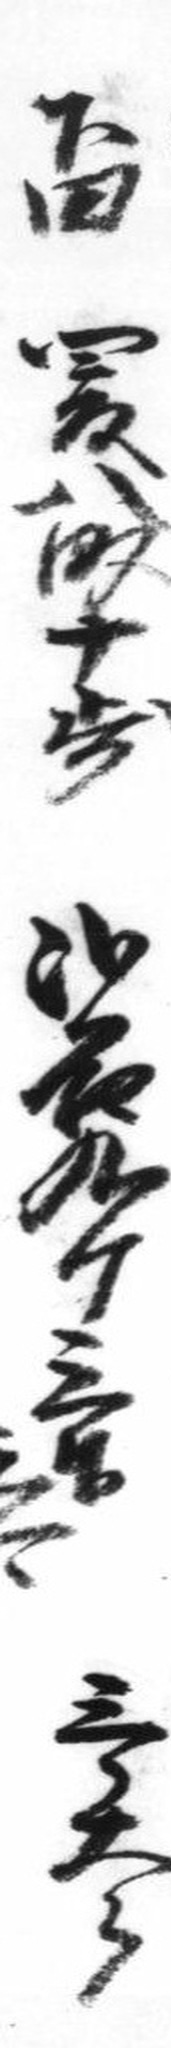下田四反八畝十歩弐石九斗三升三合三郎太郎
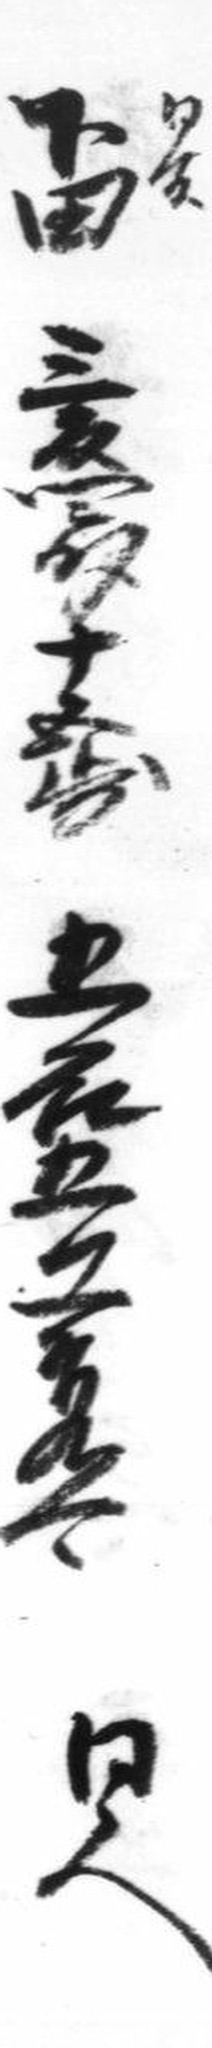下田三反四畝十五歩五石五斗一升九合同人
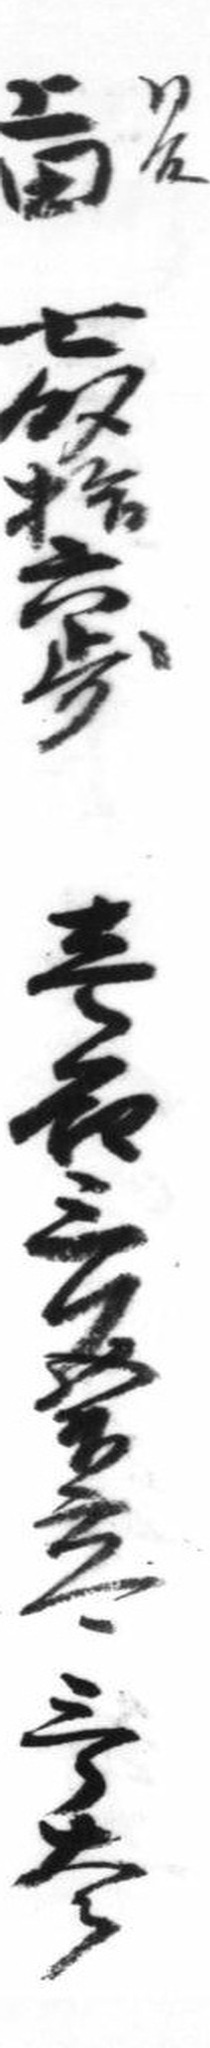上田七畝拾六歩壱石三斗五升六合三郎太郎
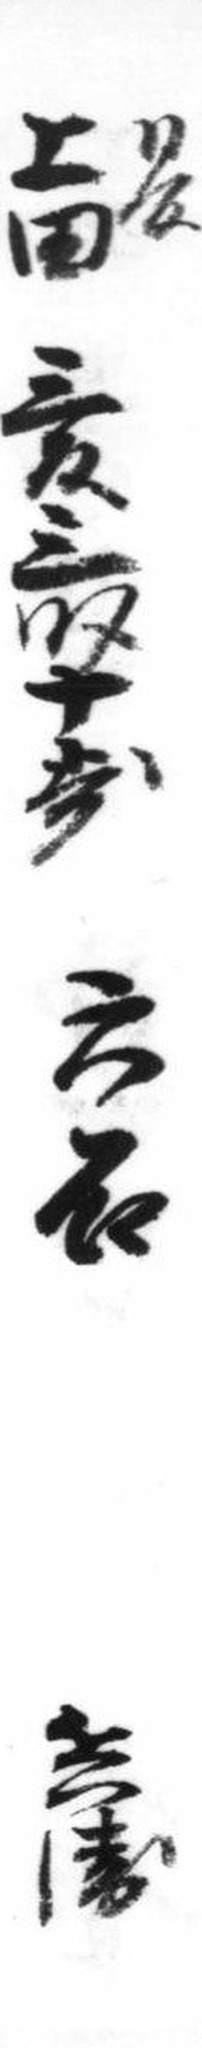上田三反三畝十歩六石兵衛
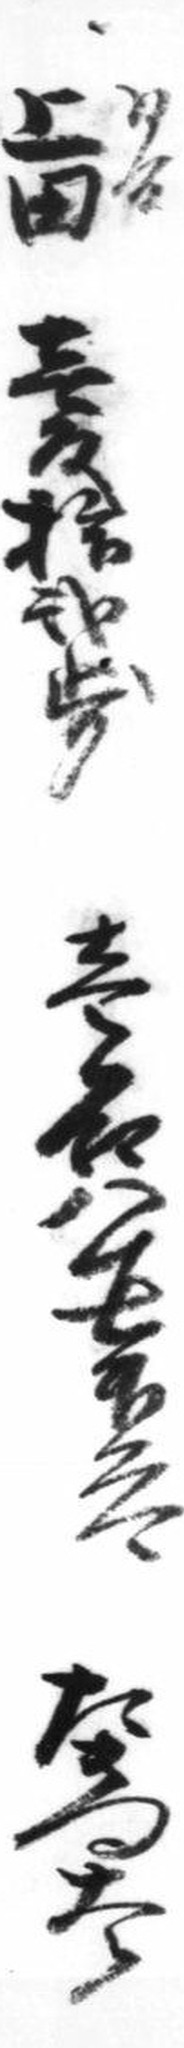上田壱反拾弐分壱石八斗七升二合左衛門太郎
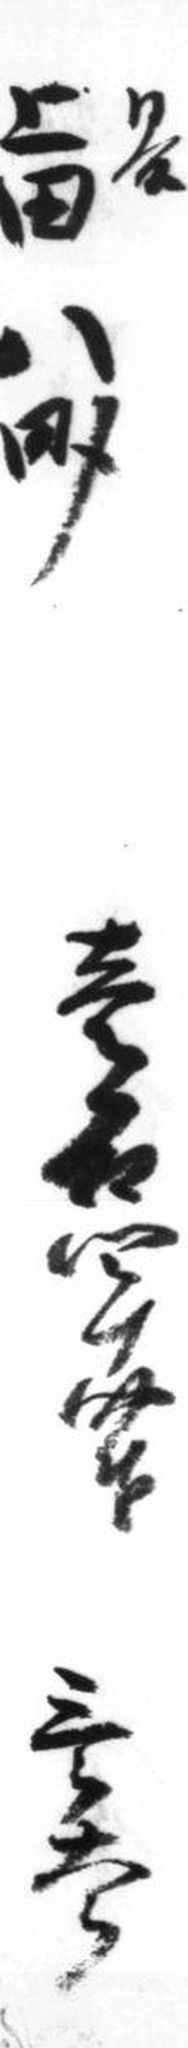上田八畝壱石四斗四升三郎太郎
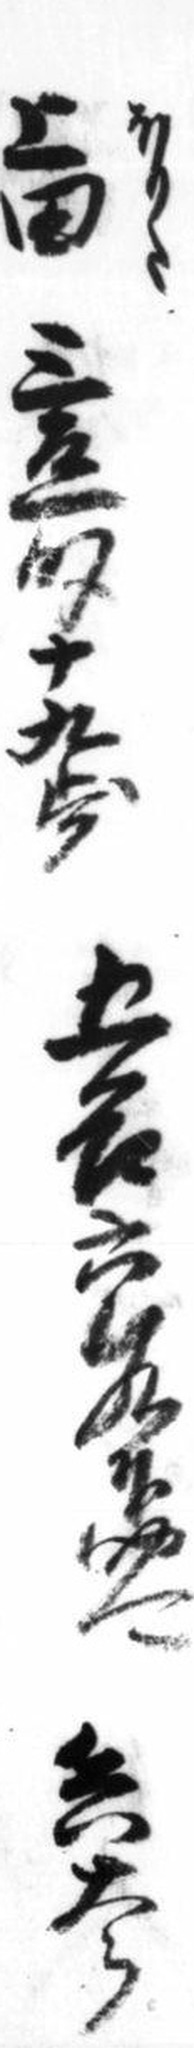上田三反一畝十九歩五石六斗九升四合兵太郎
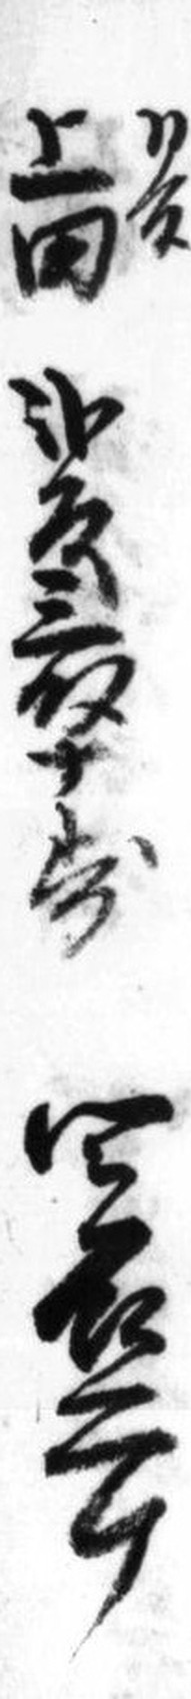上田弐反三畝十歩四石二斗同人

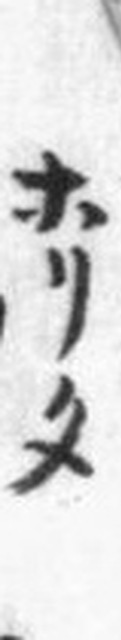ホリタ
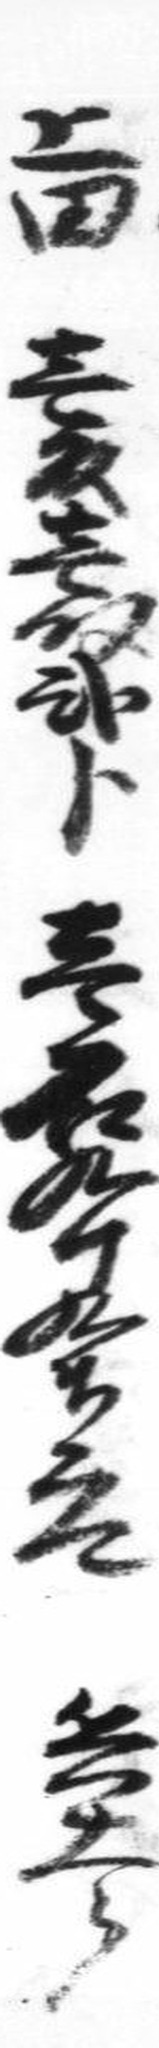上田壱反壱畝弐分壱石九斗九升二合兵太郎
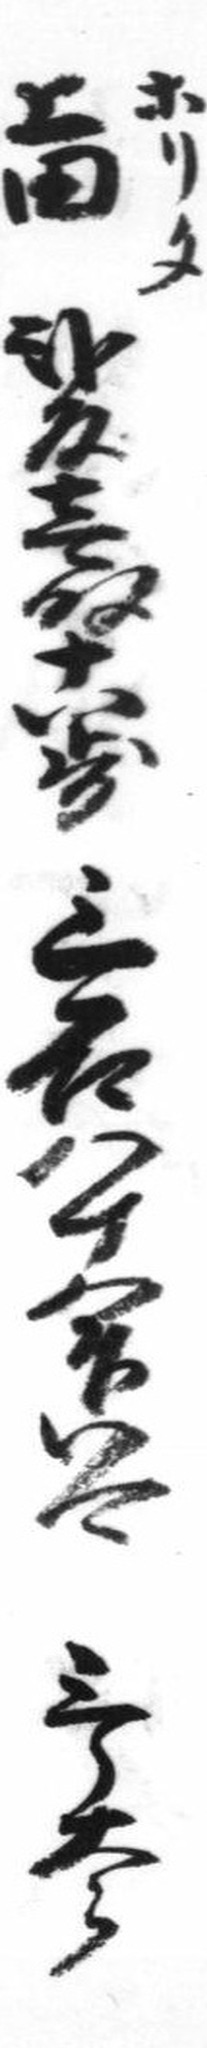上田弐反一畝十八歩三石八斗八升八合三郎太郎
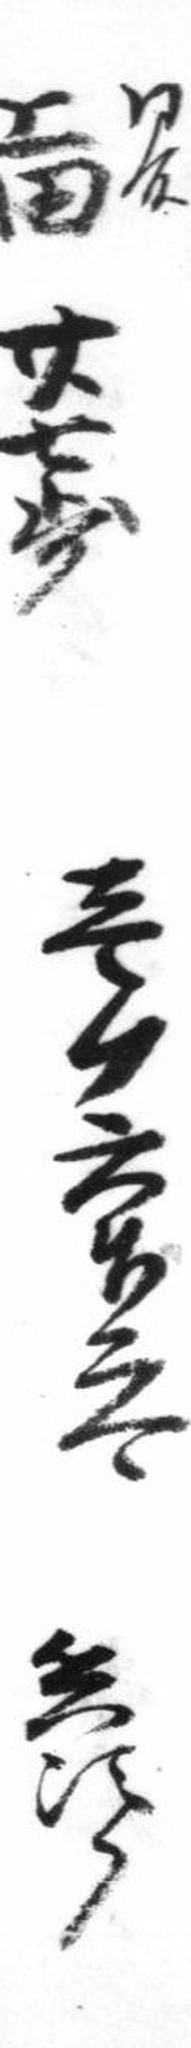上田廿七歩壱斗六升二合兵次郎
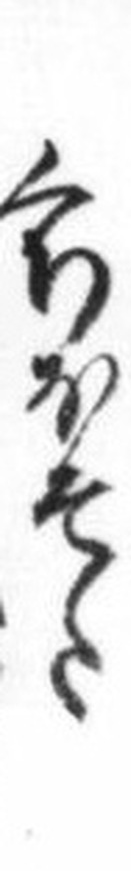くりほそた

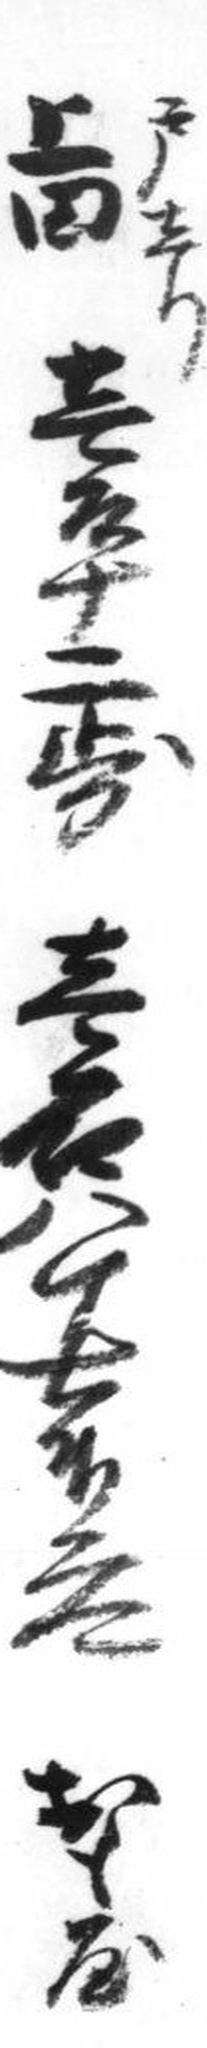上田壱反十二歩壱石八斗七升二合出メ屋
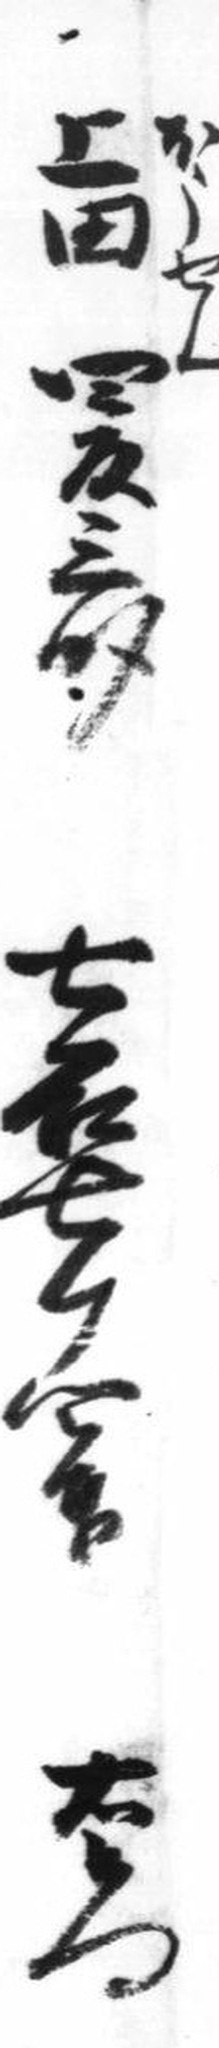上田四反三畝七石七斗四升右衛門
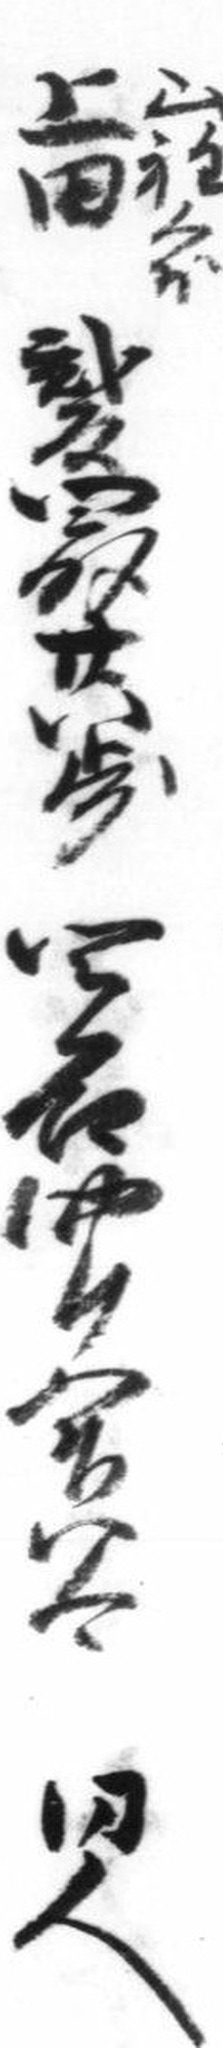上田弐反四畝廿八歩四石四斗八升八合同人
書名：越前国大野郡今井村御検地帳
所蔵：福井県文書館 Fukui Prefectural Archives
